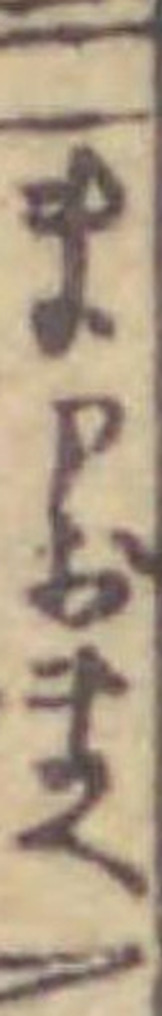まアおまへ
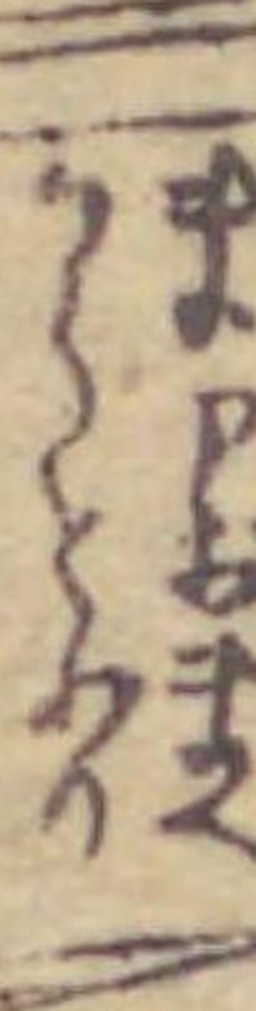からとふり
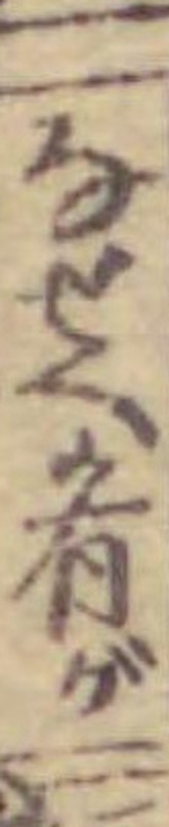なせへ有が
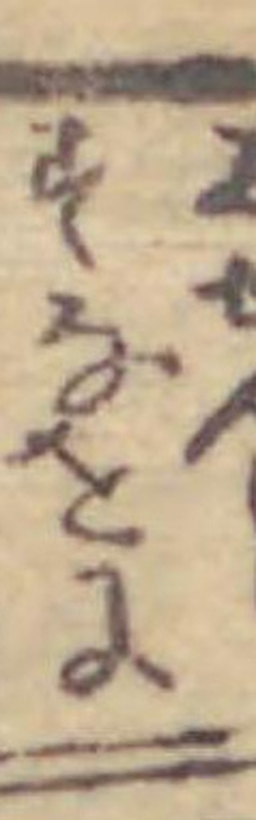すなをに
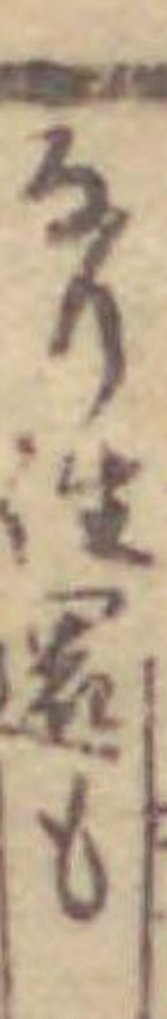なり往還も
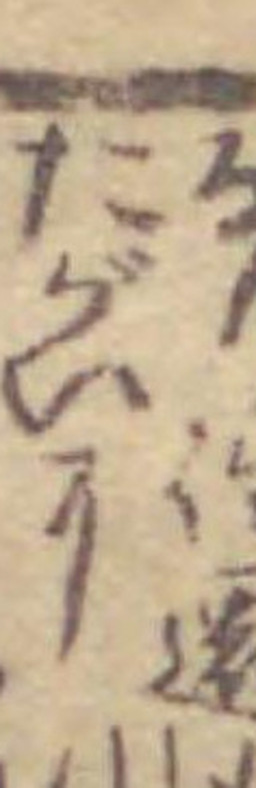たがいに
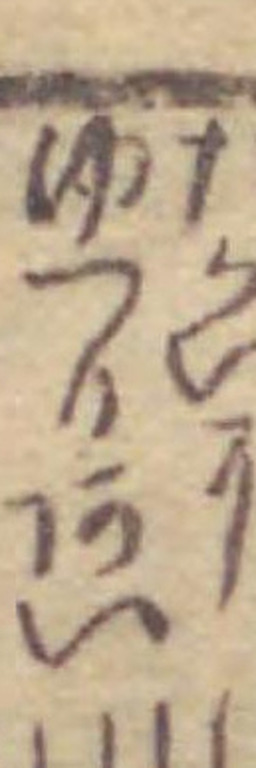ゆつりあい
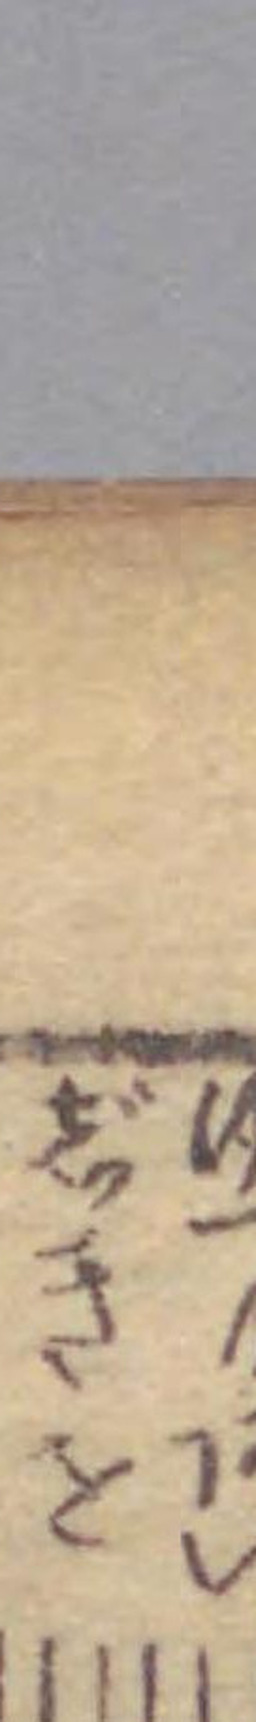じきを
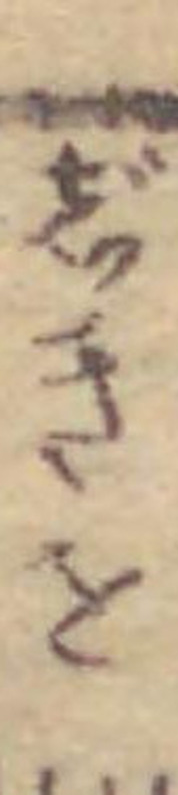じきを
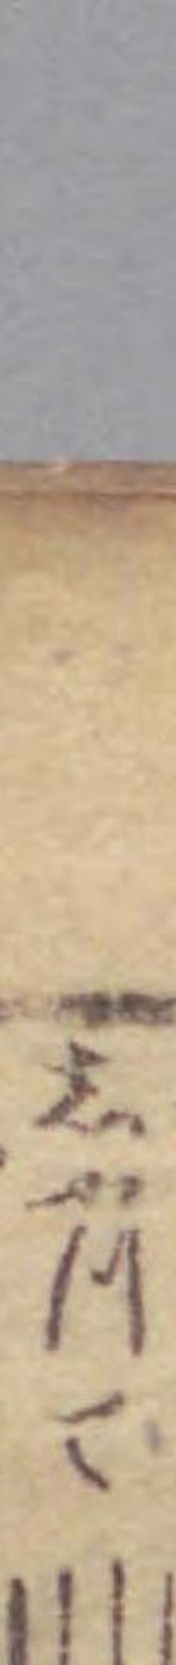しやつて
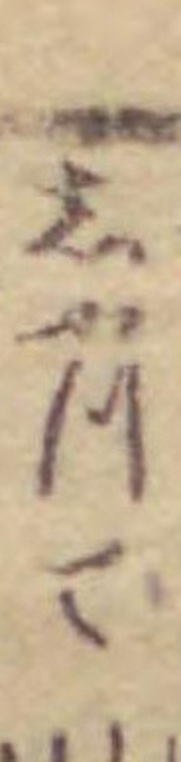しやつて
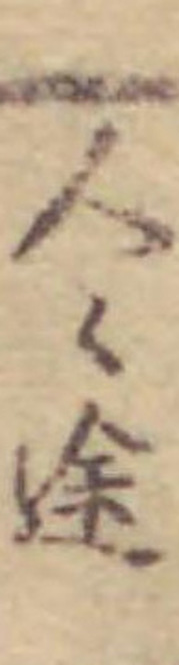人々途
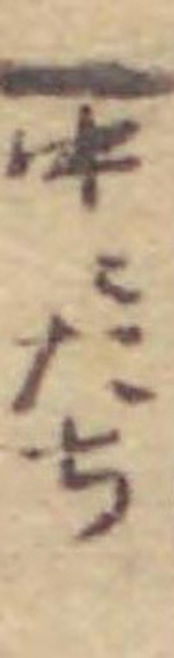中にたち
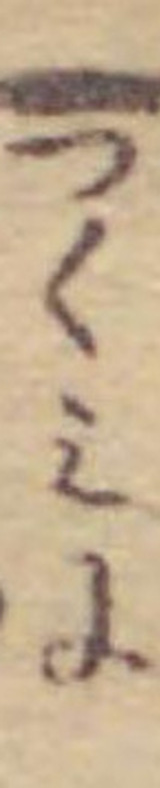つくみに
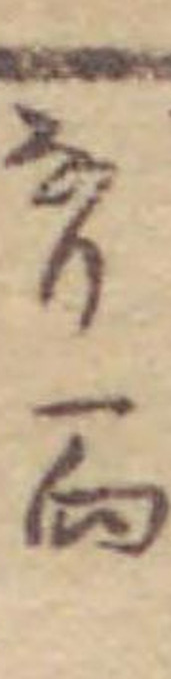なり一面
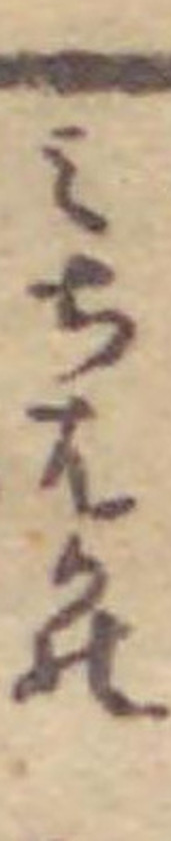みちはかの
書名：天下一面鏡梅鉢 : 3巻
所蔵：国立国会図書館 National Diet Library, JAPAN
